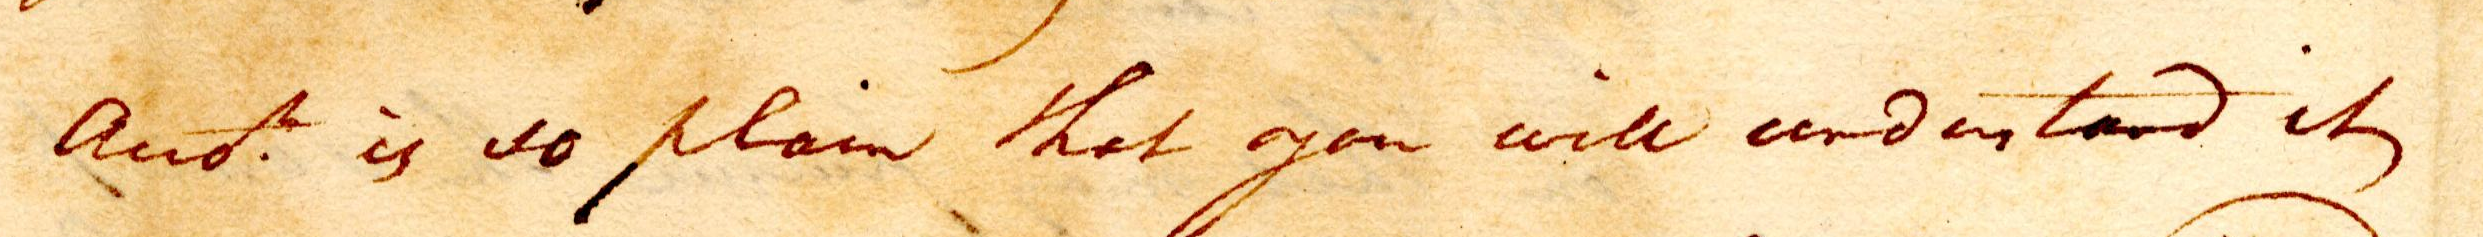Acco^t. is so plain that you will understand it
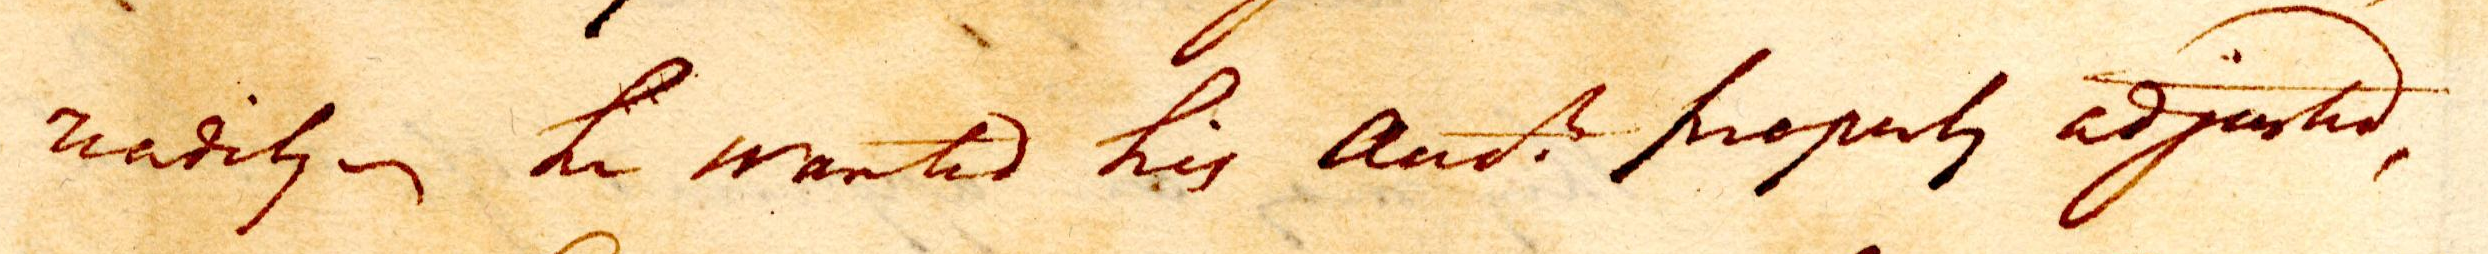readily.- he wanted his Acco^t. properly adjusted,
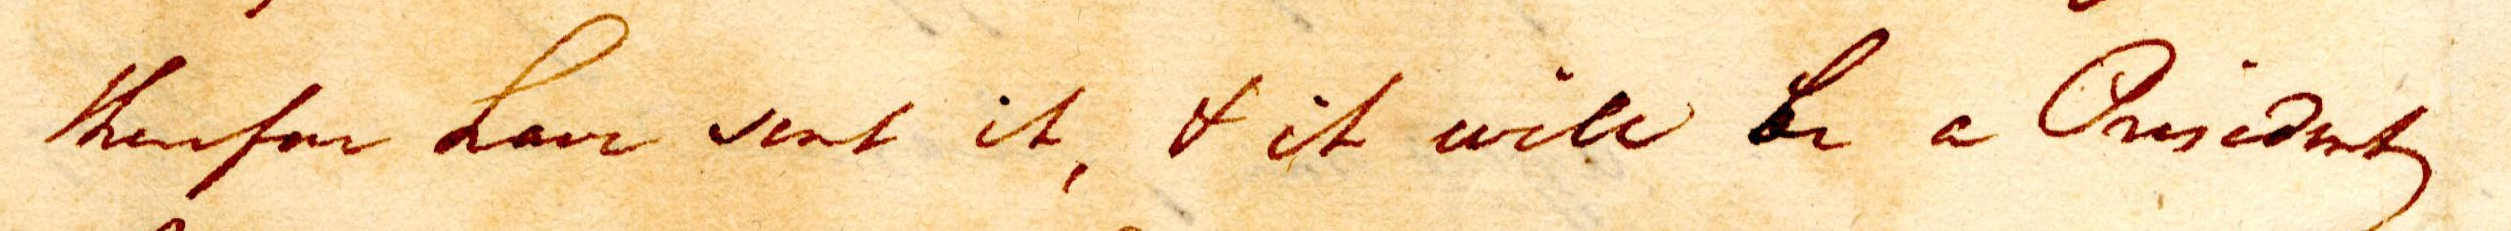therfor have sent it, & it will be a President
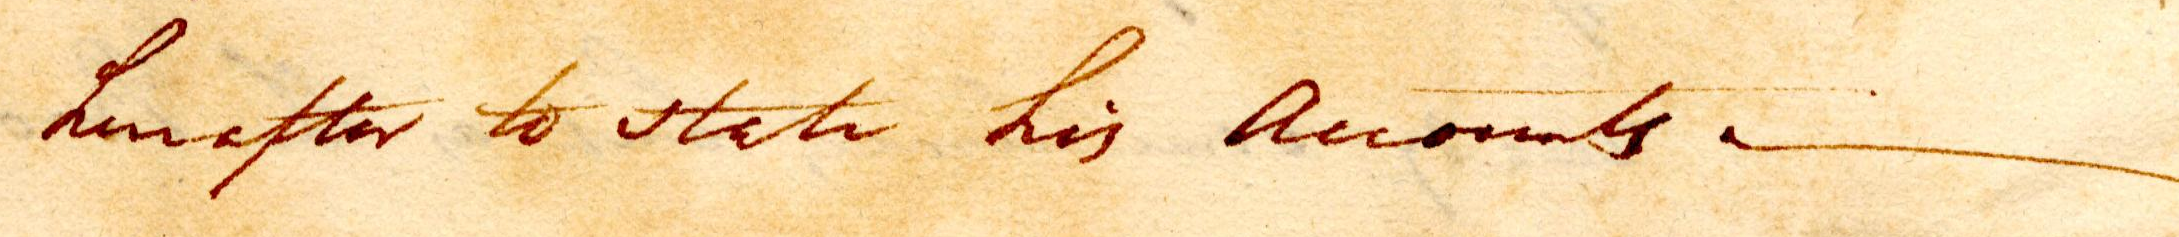herafter to state his Account.-
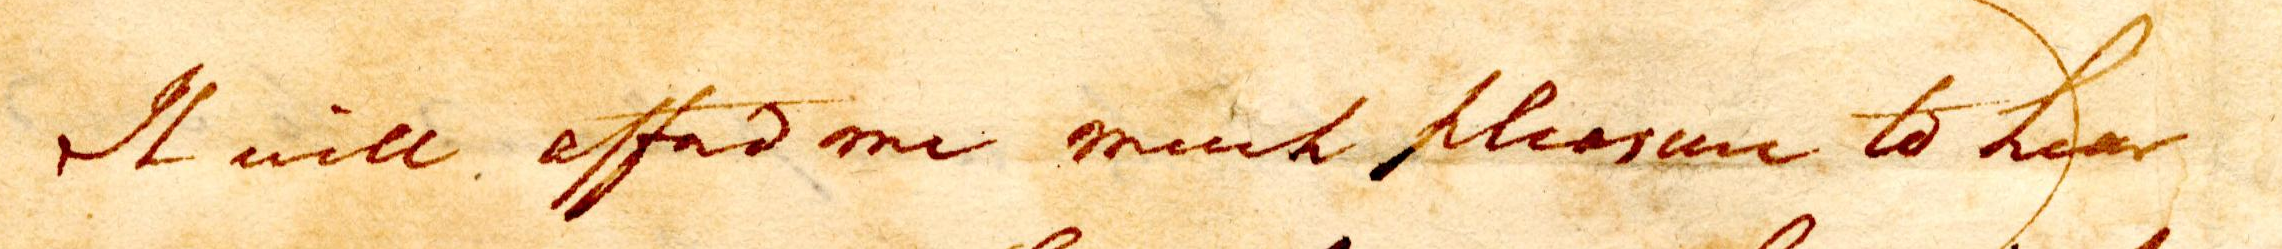It will afford me much pleasure to hear
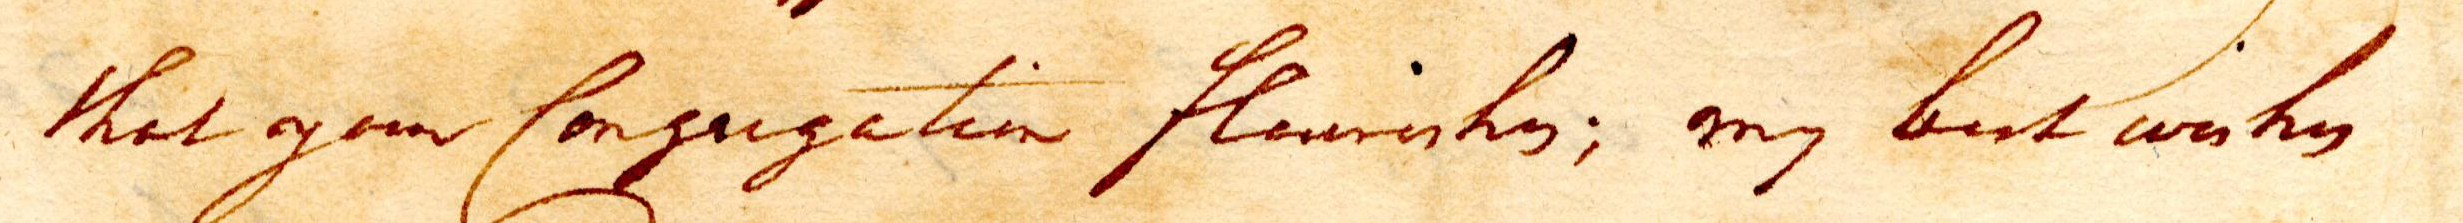that your Congregation flourishs; my best wishes
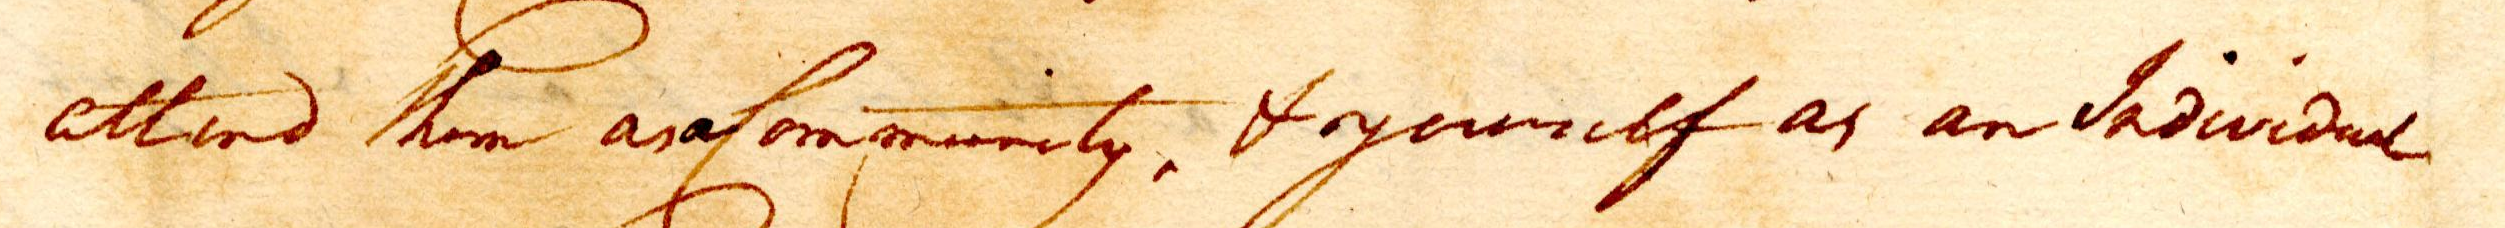attend them as a community, & yourself as an Individual
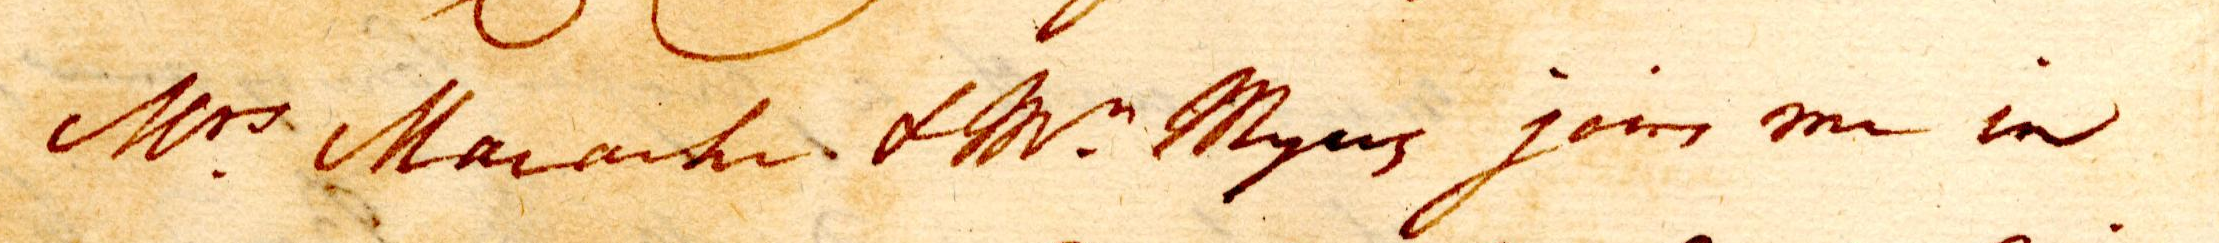M^rs. Marahe & M^r. Myers joins me in
